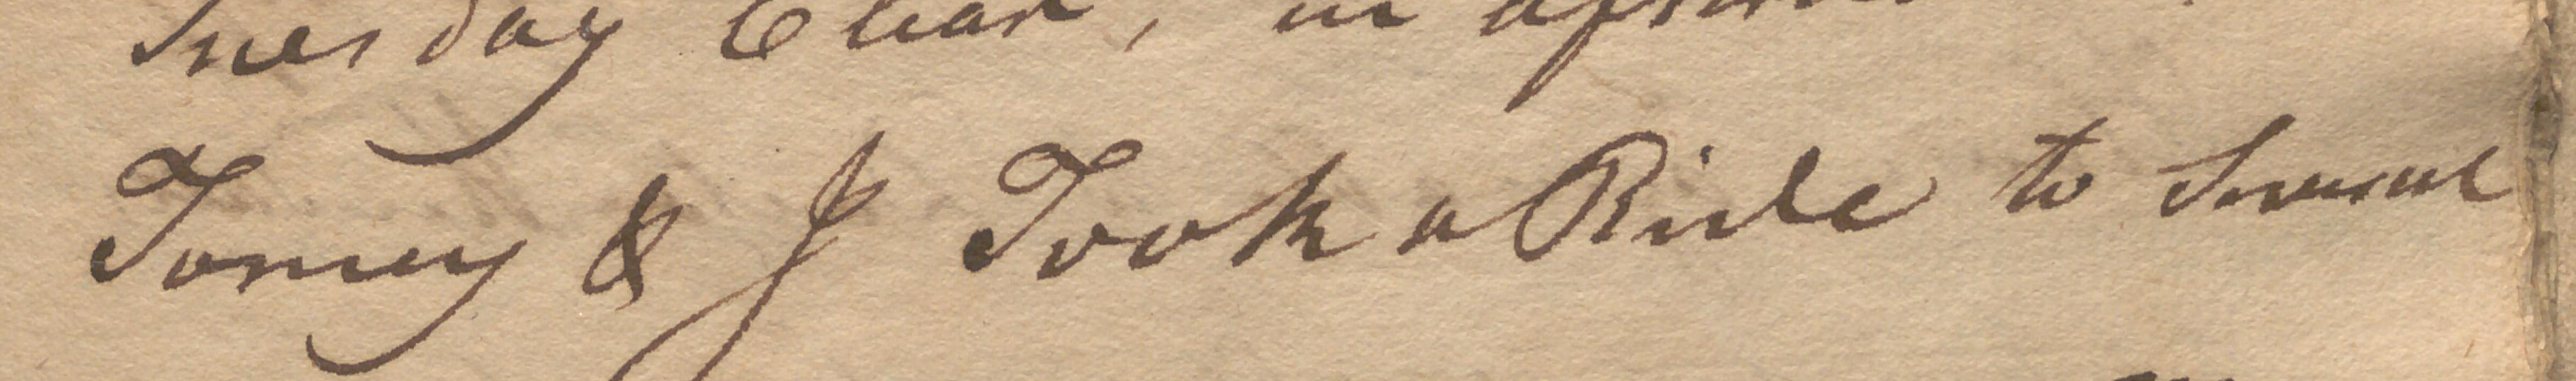Tomey & I Took a Ride to Several
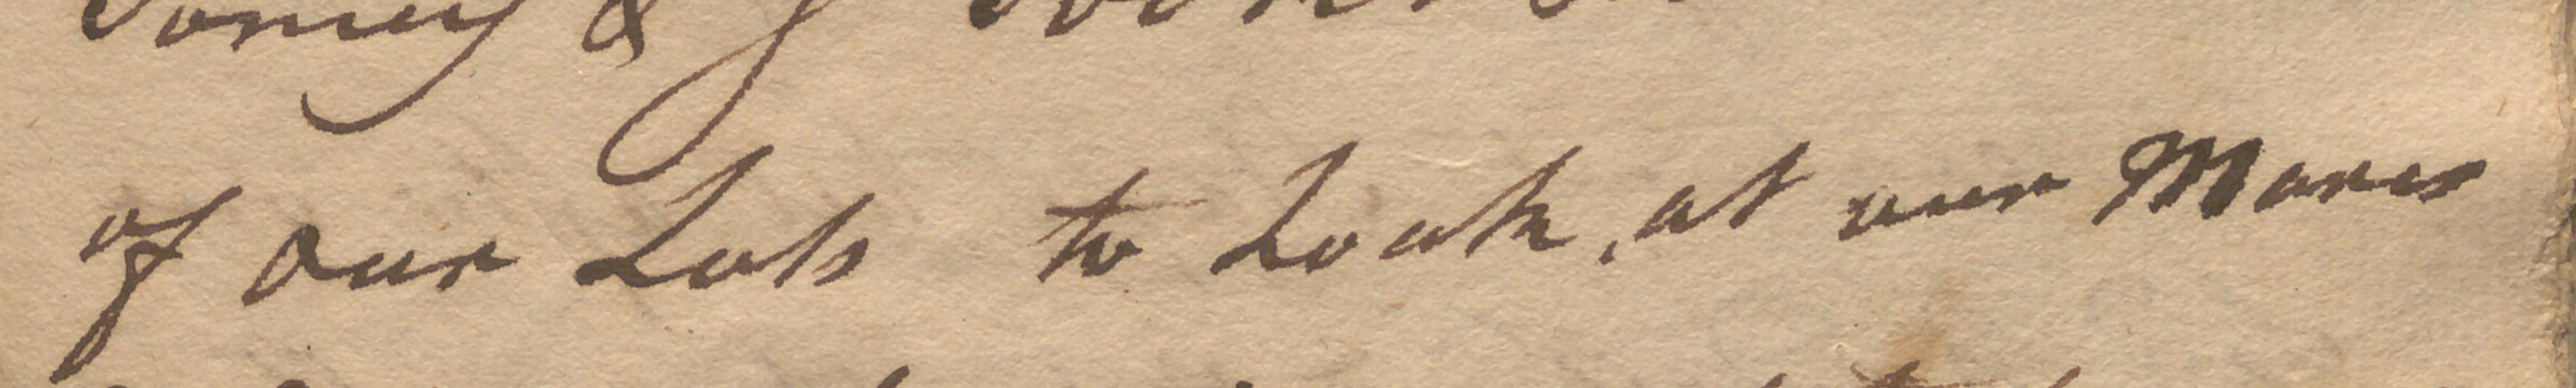of our Lots to Look at our Mares
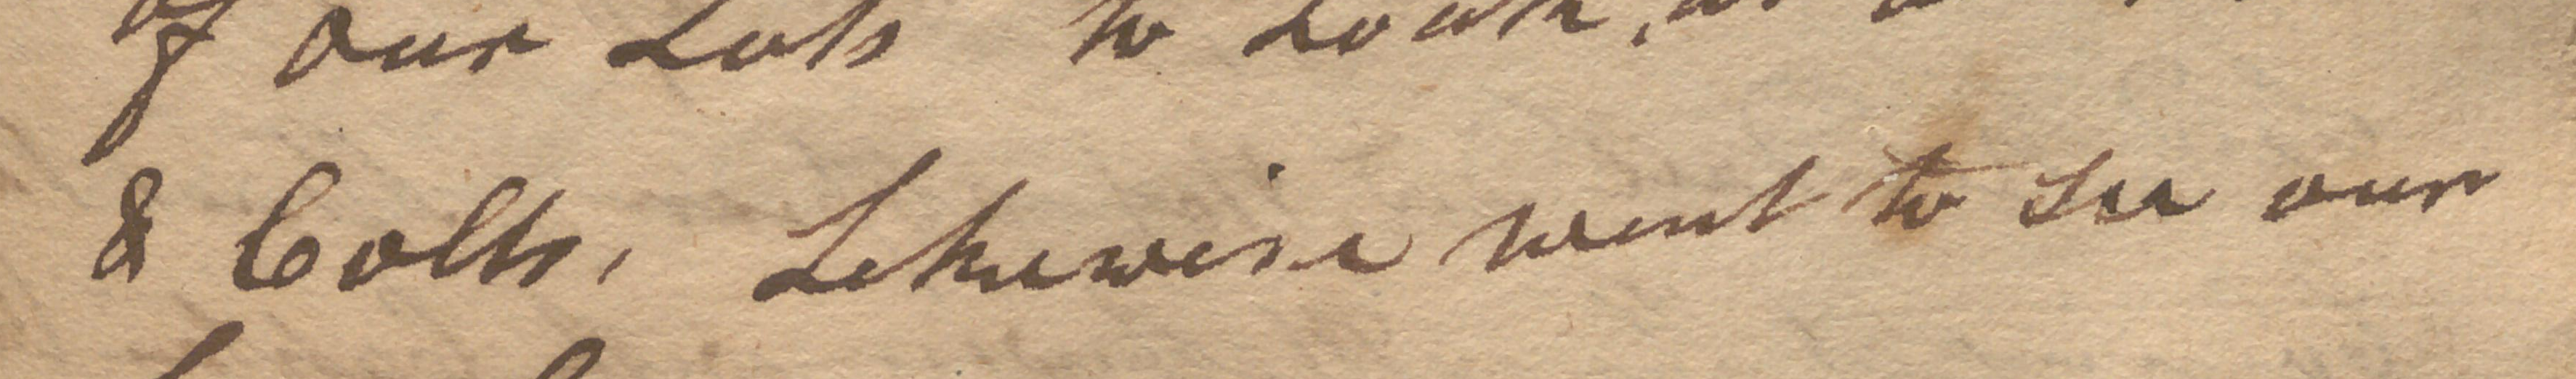& Colts, Likewise went to see our
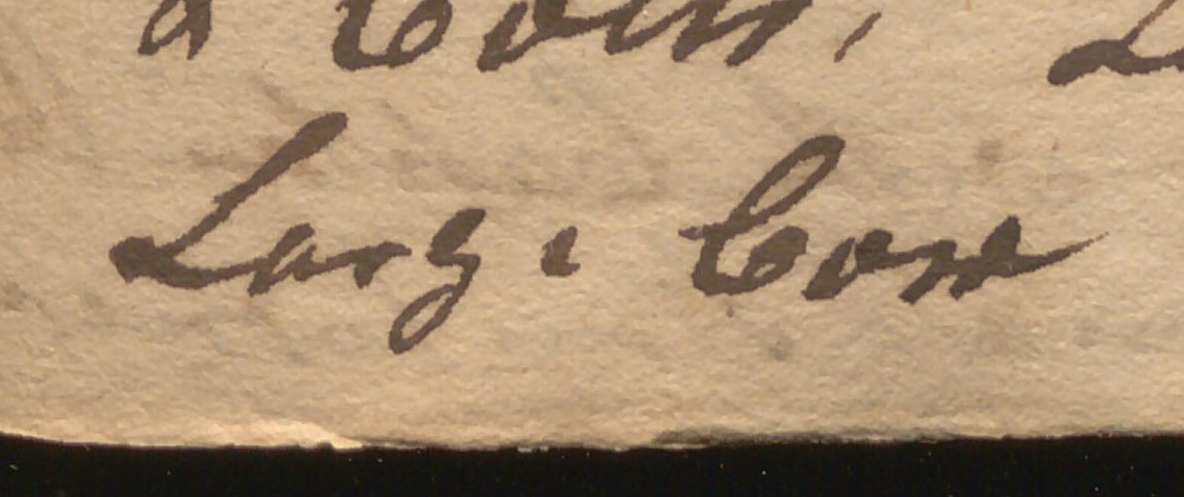Large Cow
